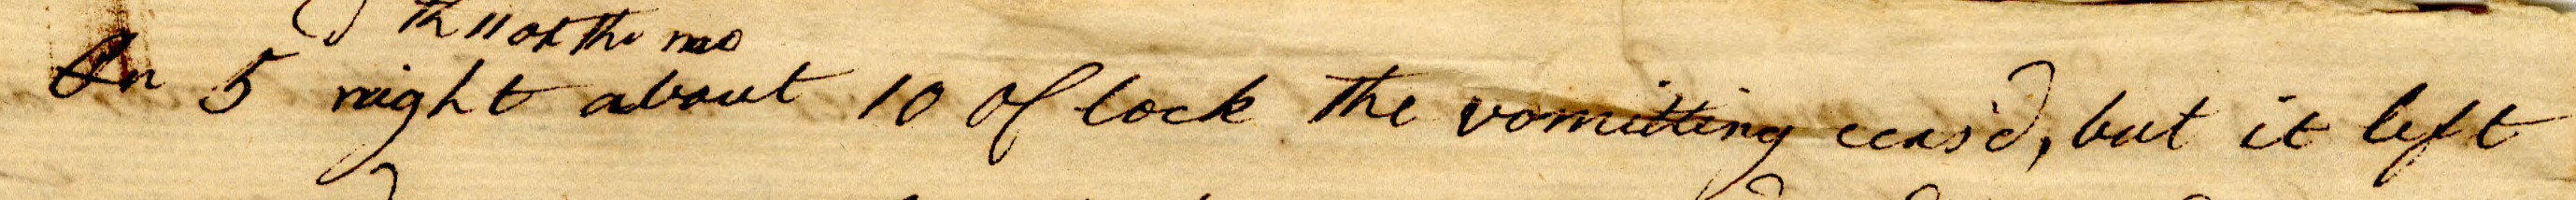On 5^d night about 10 oClock the vomitting ceas'd, but it left
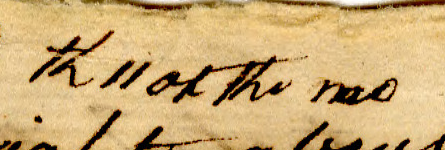th 11 of the mo
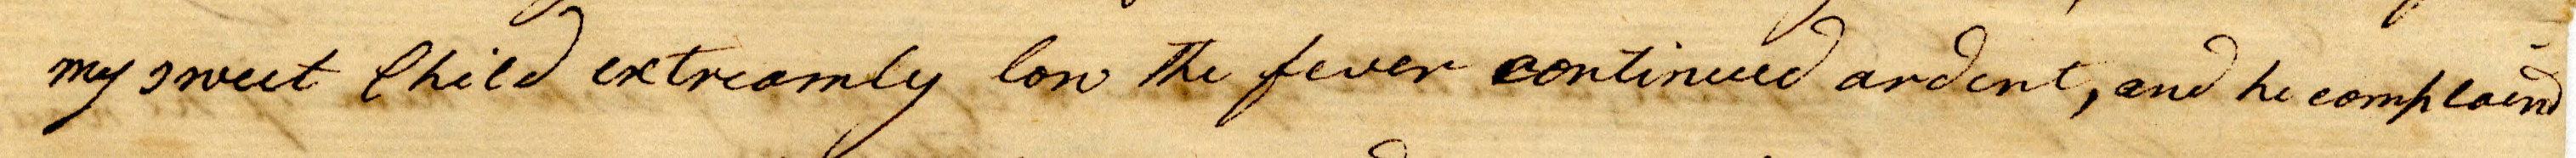my sweet Child extreamly low The fever continued ardent, and he complaind
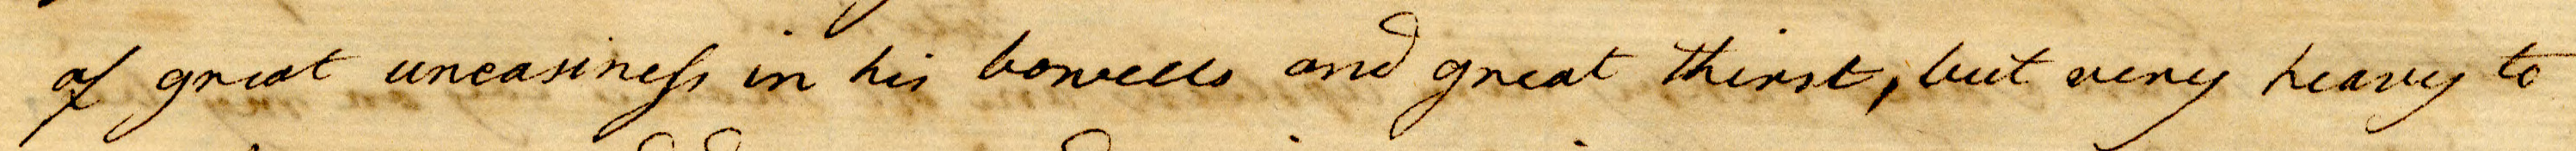of great uneasiness in his bowells and great thirst, but very heavy to
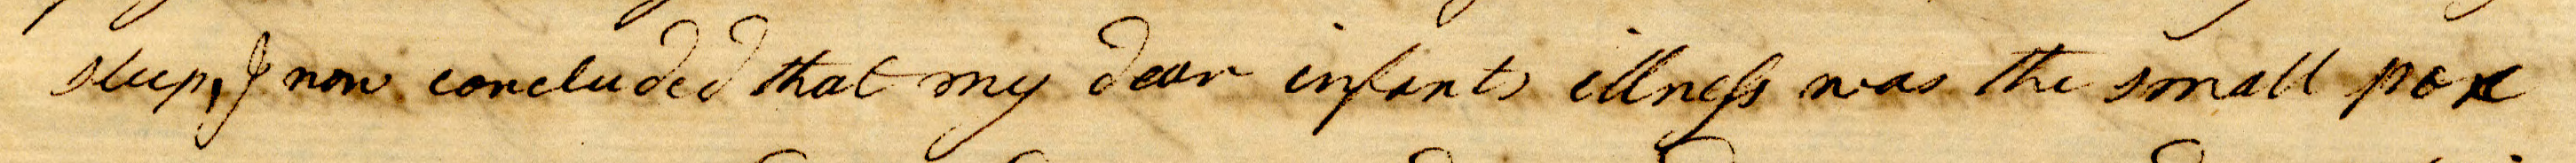sleep, I now concluded that my dear infants illness was the small pox
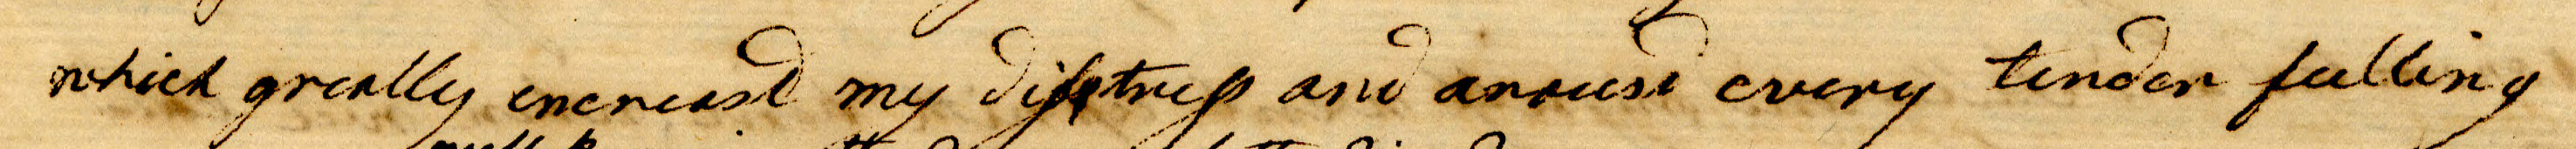which greatly encreased my distress and arousd every tender feelling
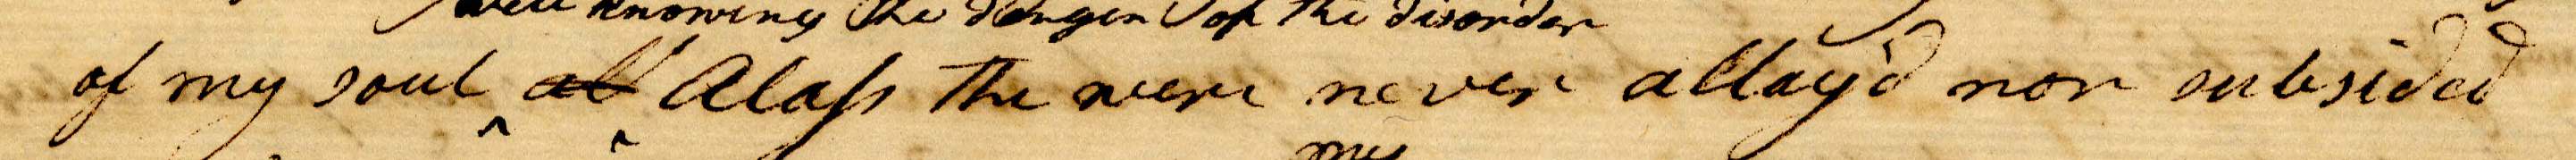of my soul ^ [all] ^ Alas the were never allay'd nor subsided
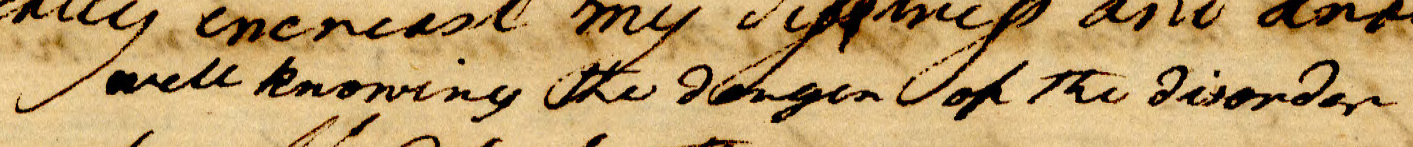well knowing the danger of the disorder
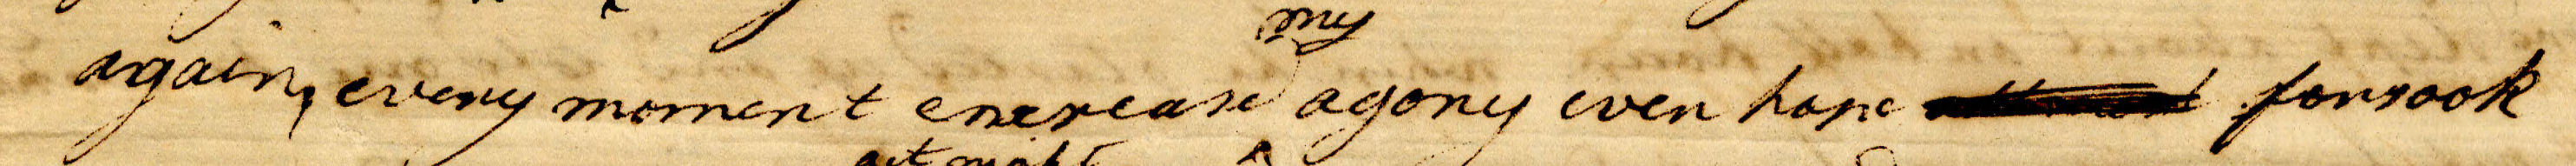again, every moment encreasd ^ agony even hope [_______] forsook
